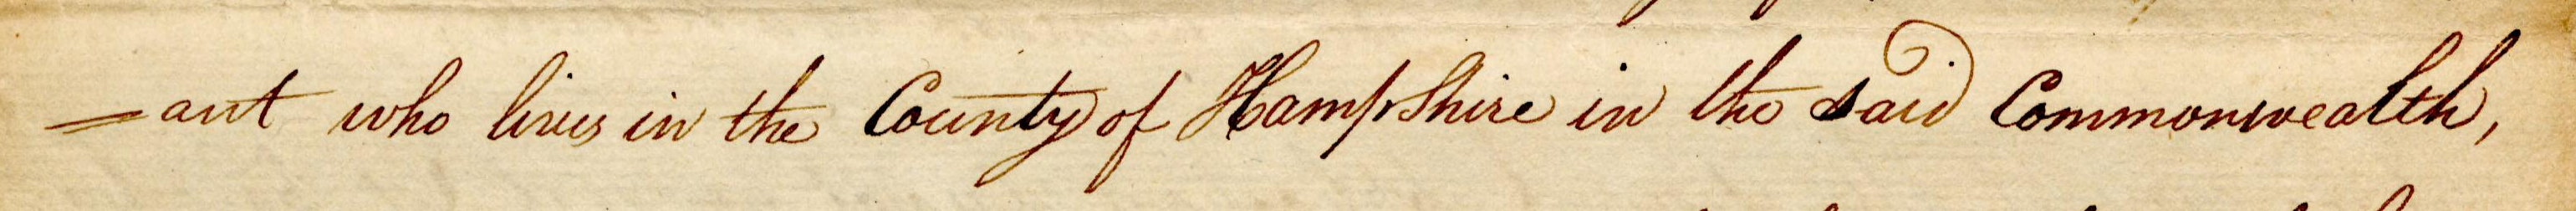-ant who lives in the County of Hampshire in the said Commonwealth,
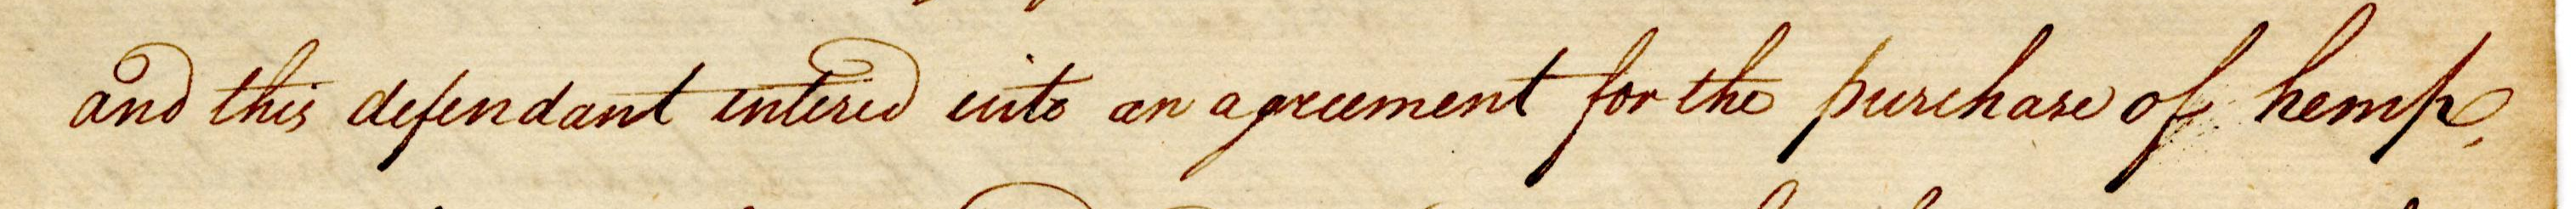and this defendant entered into an agreement for the purchase of hemp,
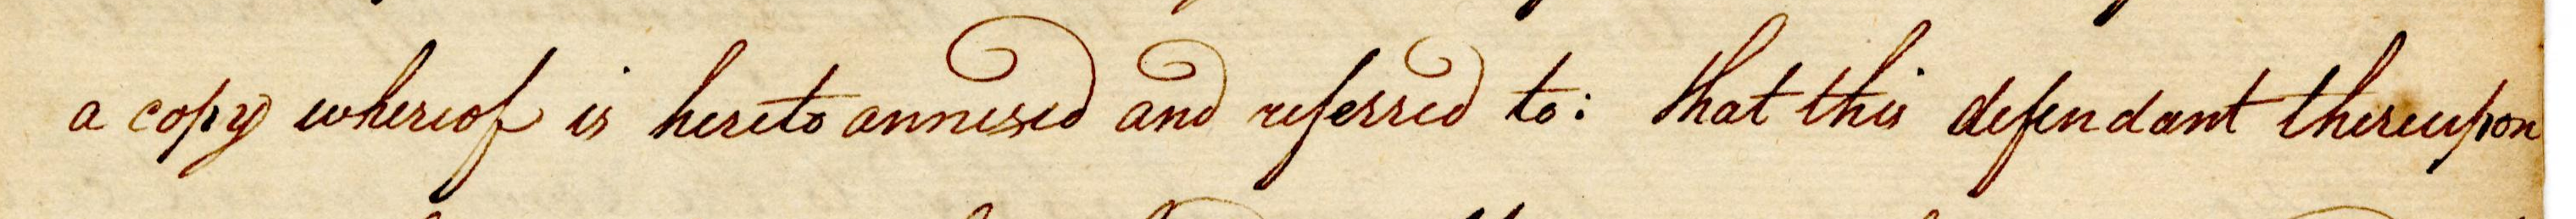a copy whereof is hereto annexed and referred to: that this defendant thereupon
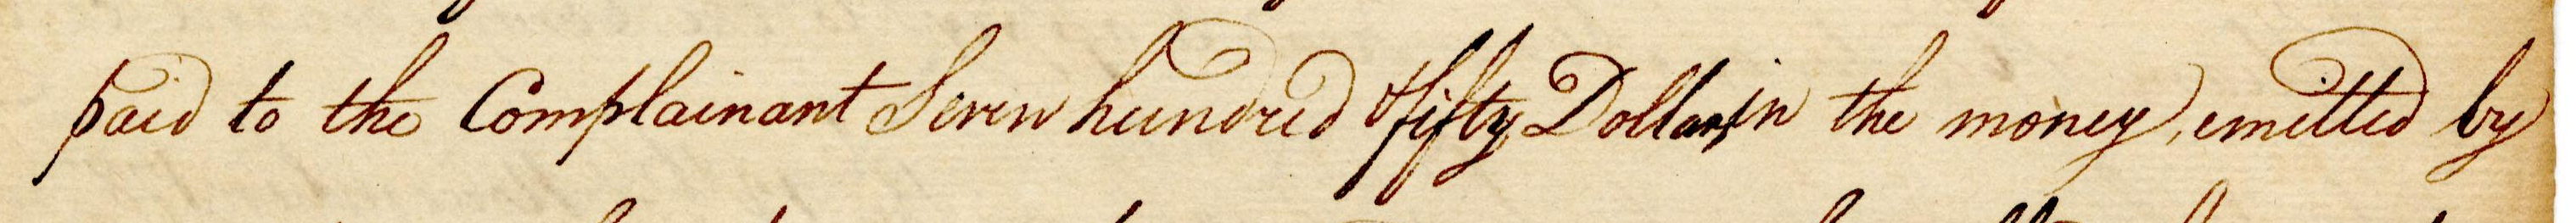paid to the Complainant Seven hundred & fifty Dollars in the money emitted by
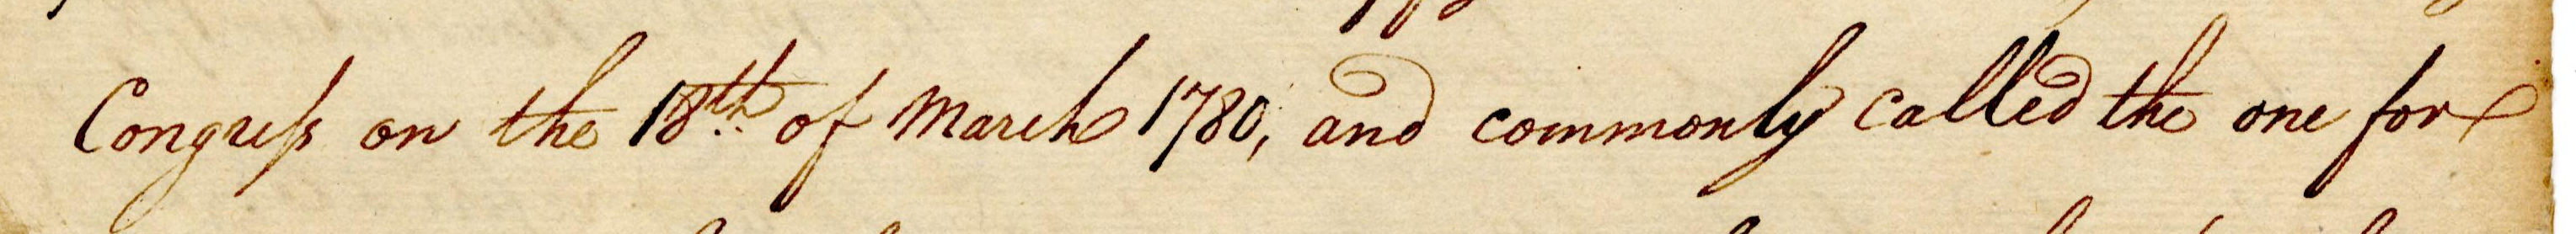Congress on the 18^th. of March 1780, and commonly called the one for
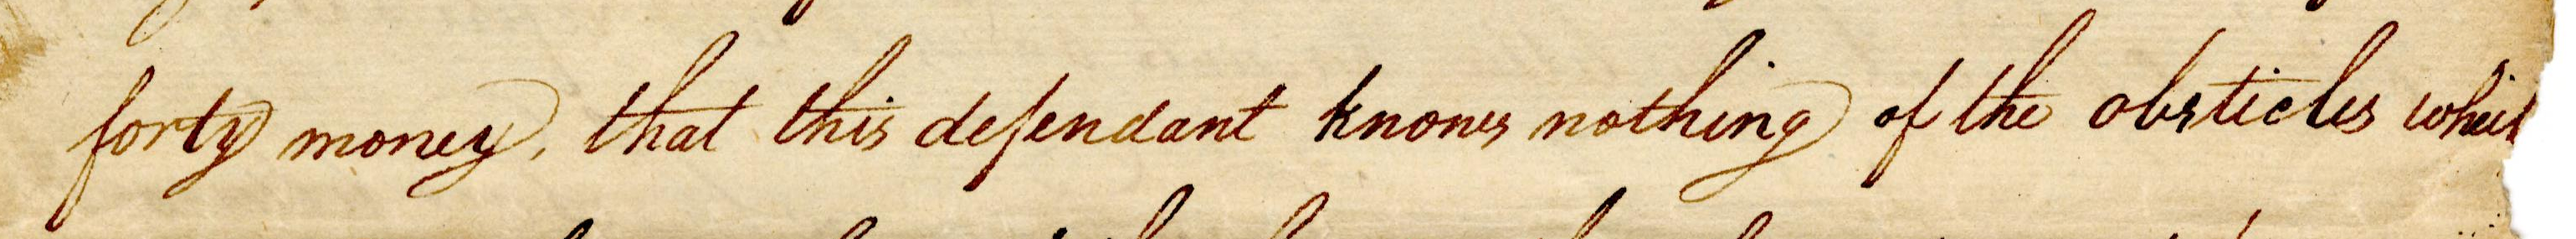forty money, that this defendant knows nothing of the obstacles which
